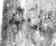凡
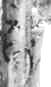○（秋）
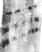三
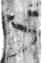月
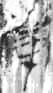庚
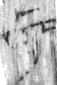辛
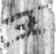壬
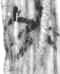癸
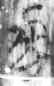丙
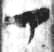丁
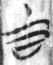吉
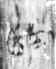甲
